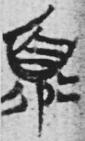寡
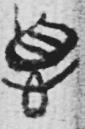惪（德）
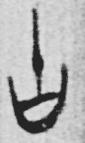古（故）
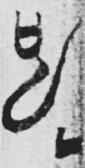也
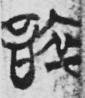○（祈）
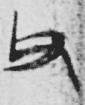父
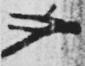之
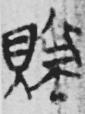○（責）
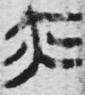亦
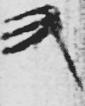又（有）
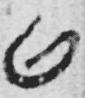㠯（以）
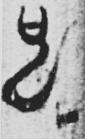也
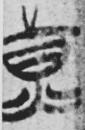黃
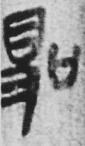鳴〈鳥〉
